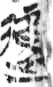○（復）
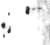於
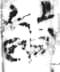○（怨）
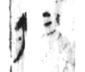於
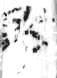○（媚）
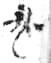申
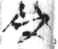凡
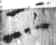工（空）
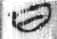日
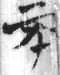不
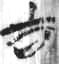吉
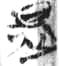是
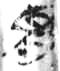胃（謂）
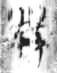無
